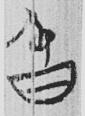昏（問）
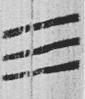三
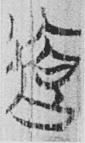○（去）
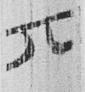亓（其）
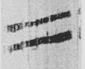二
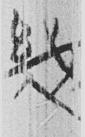幾（豈）
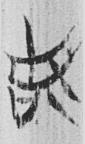若
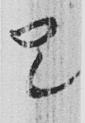已
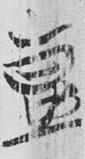彭
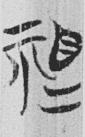祖
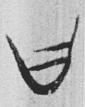曰
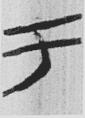女（汝）
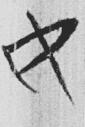女（汝）
